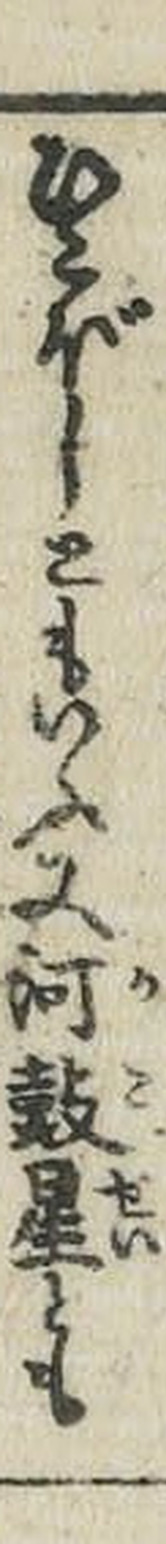ひこぼしともいふ又河鼓星とも
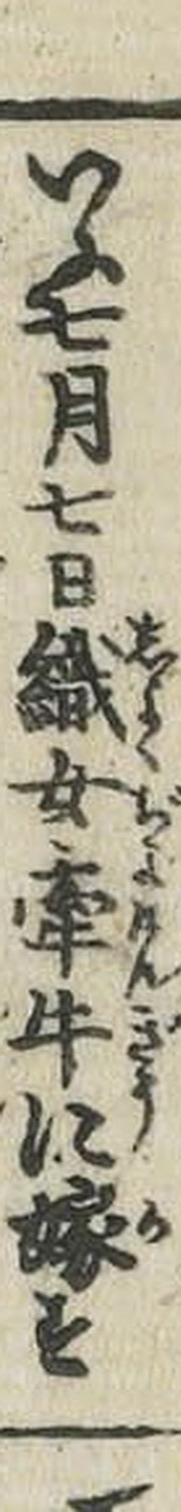いふ七月七日織女牽牛に嫁す
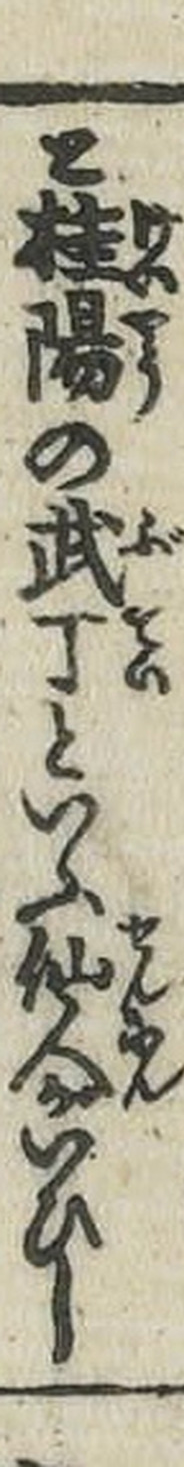と桂陽の武丁といふ仙人がいひし
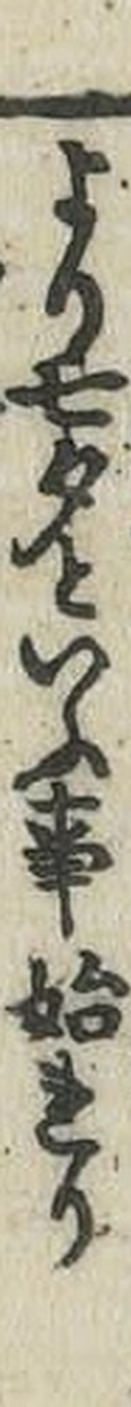より七夕といふ事始れり
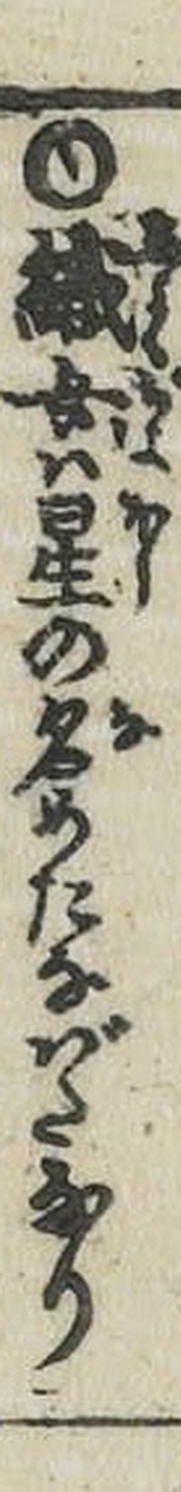○織女は星の名めたなばたなり
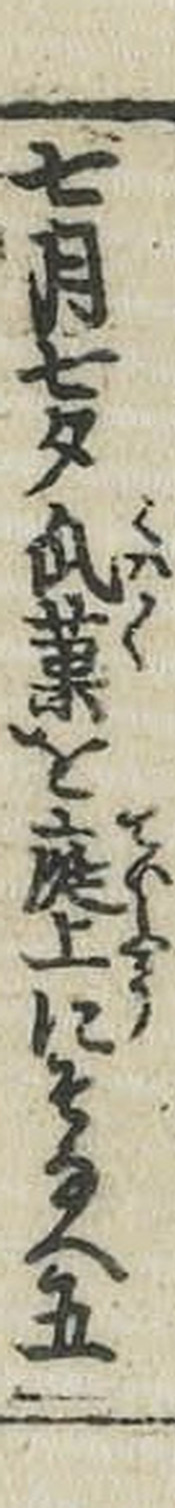七月七夕瓜菓を庭上にそなへ五
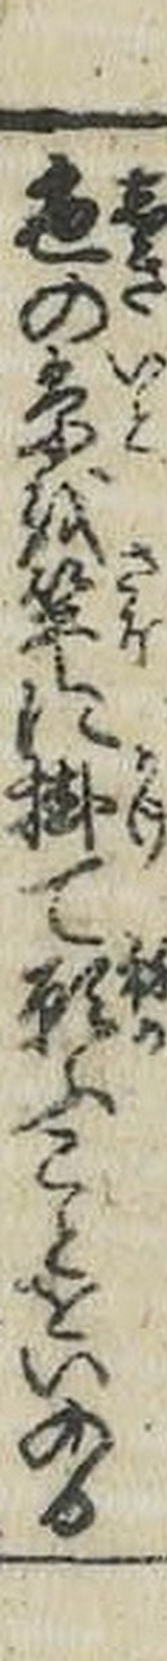色の糸を竿に掛て願ふことをいのる
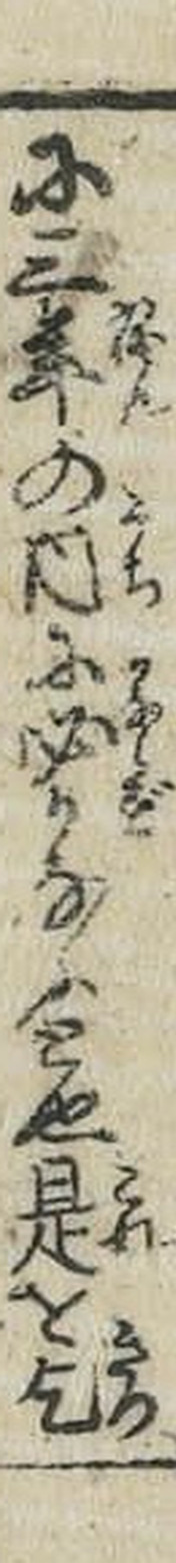に三年の内に必かなふと也是を乞

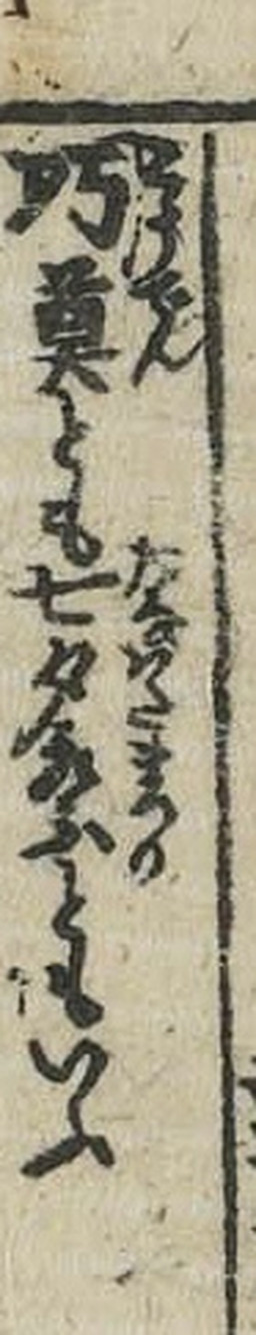巧奠とも七夕祭ともいふ
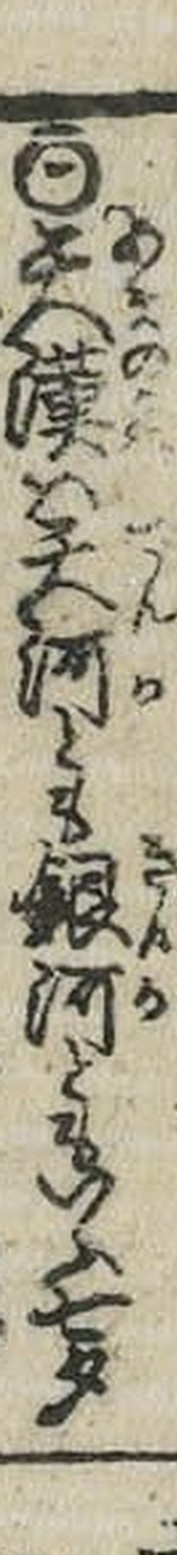○天漢は天河とも銀河ともいふ七夕
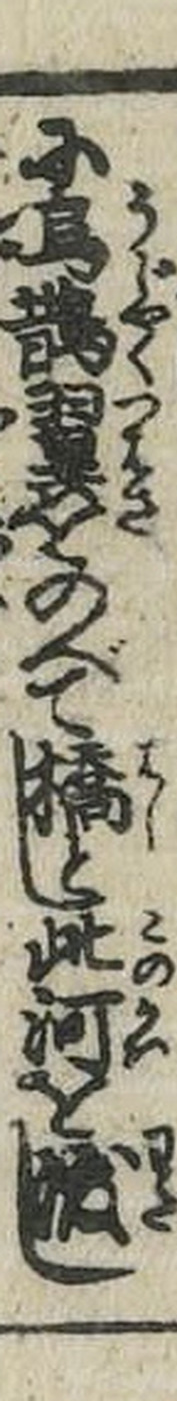に烏鵲翼をのべて橋とし此河を渡し
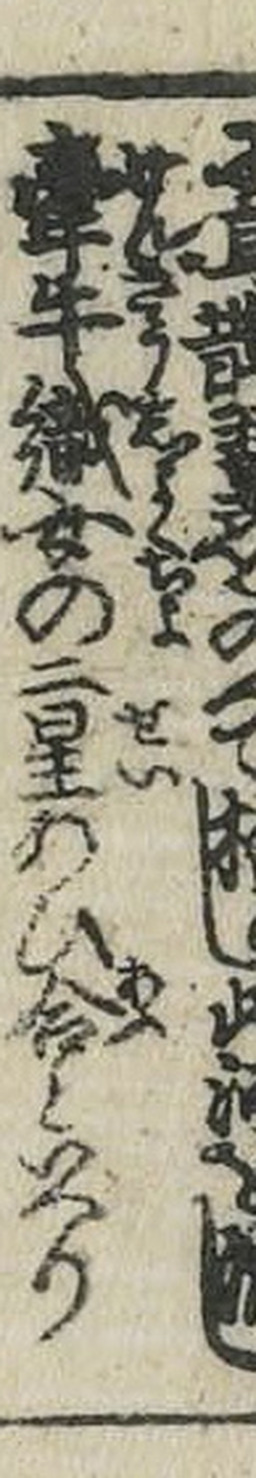牽牛織女の二星あひ合といへり
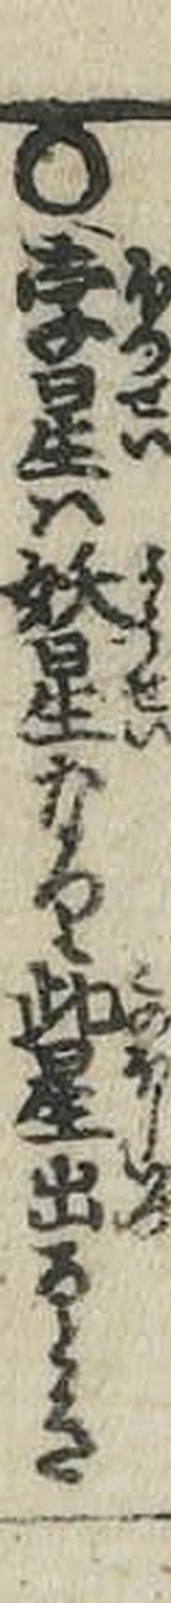○孛星は妖星なり此星出るとき
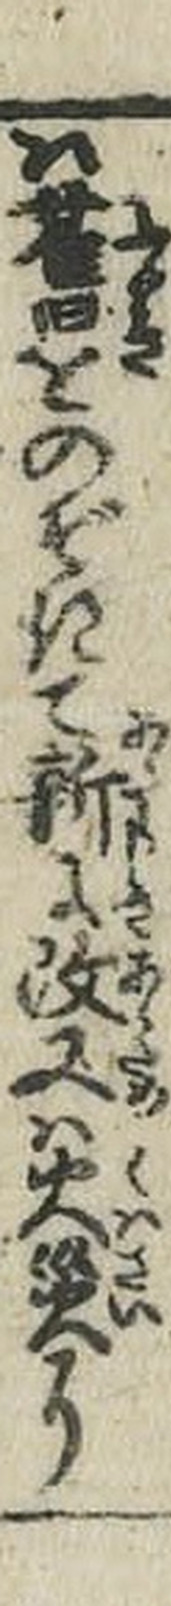は旧をのぞきて新に改又は火災に
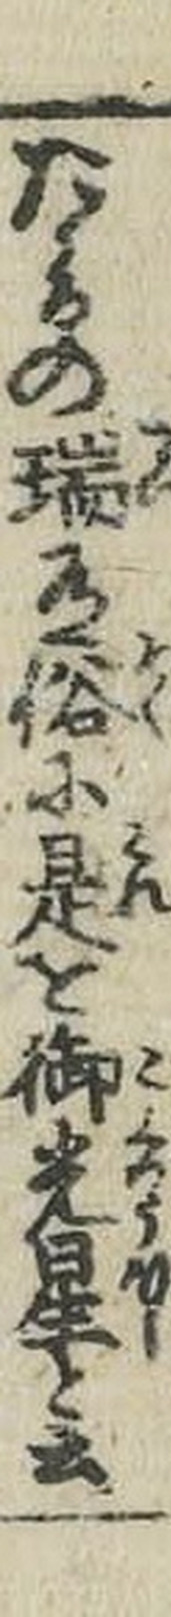たゝるの瑞有俗に是を御光星と云
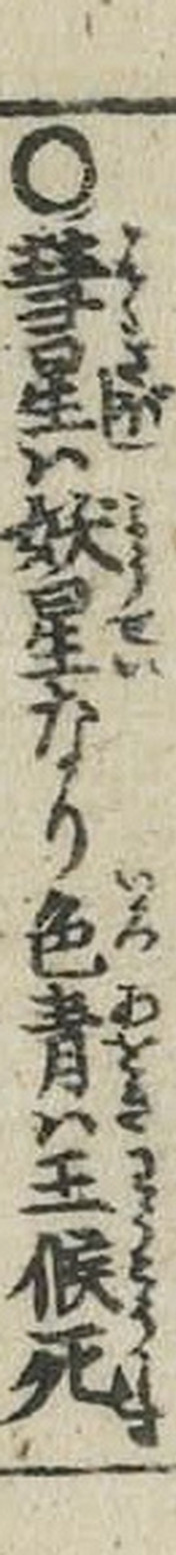○彗星は妖星なり色青は王候死
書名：増補頭書訓蒙図彙大成 10巻 2:巻之1-3
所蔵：東京学芸大学教育コンテンツアーカイブ
